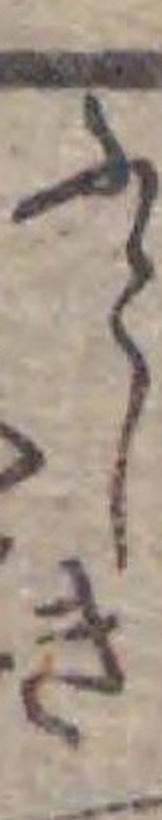ふとしき
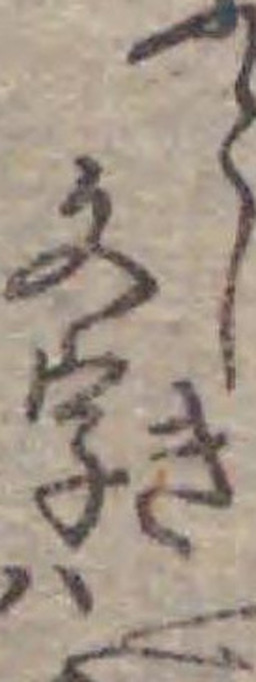文字は
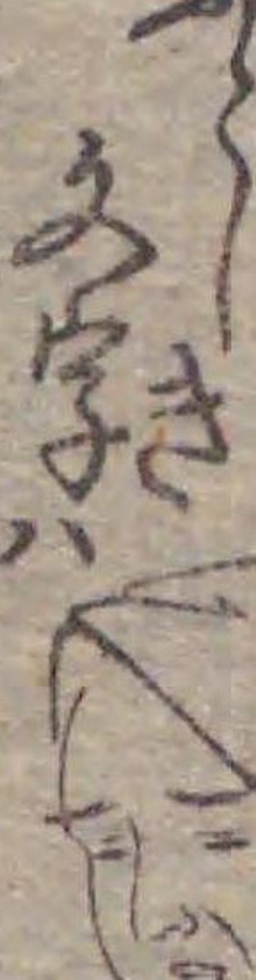文字は
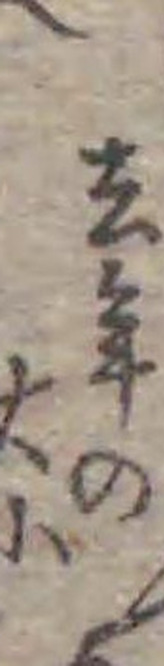去年の
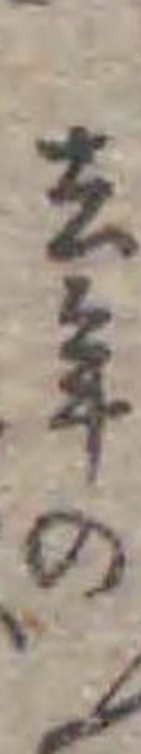去年の
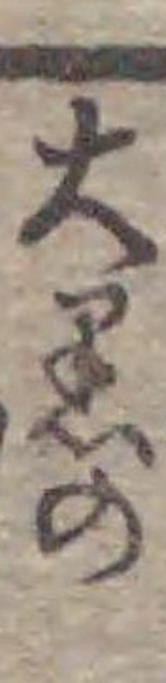大黒の
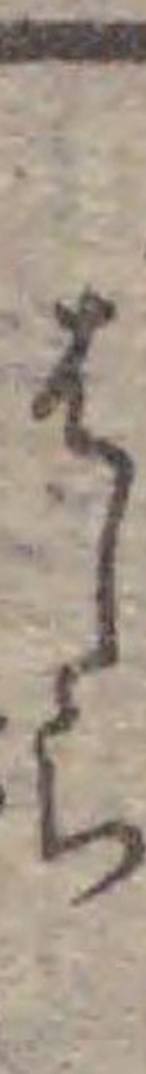はしら
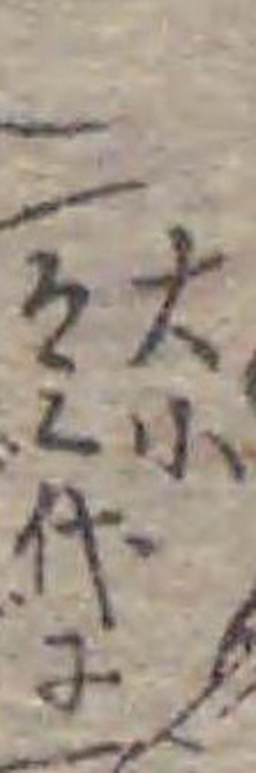かみ代に
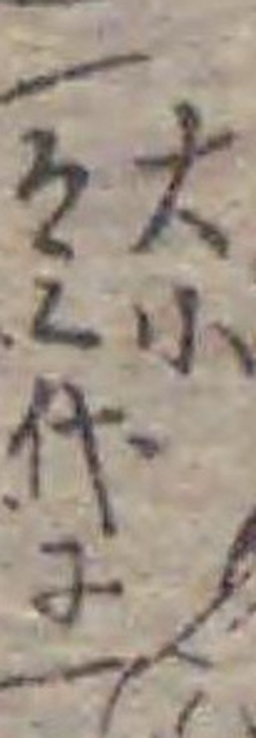かみ代に
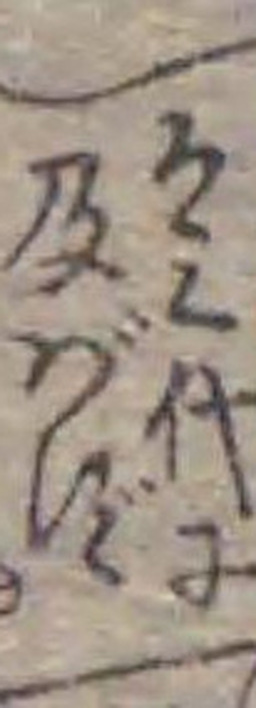及ばず
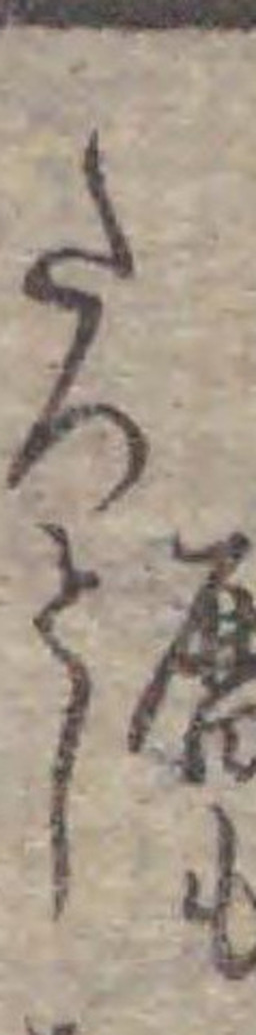たつとし
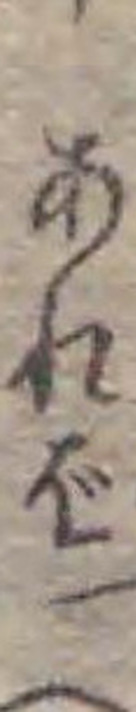あれば
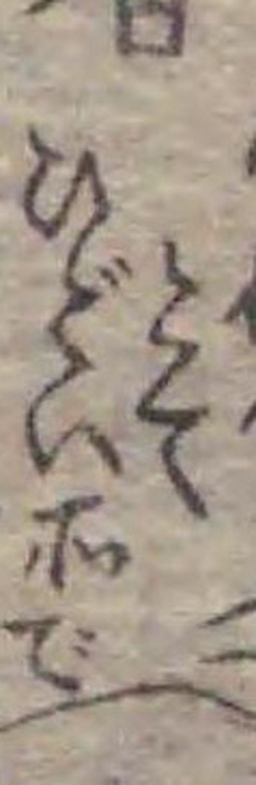ひどい所で
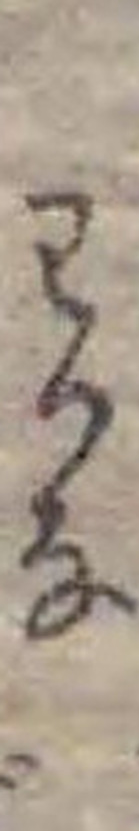わかな
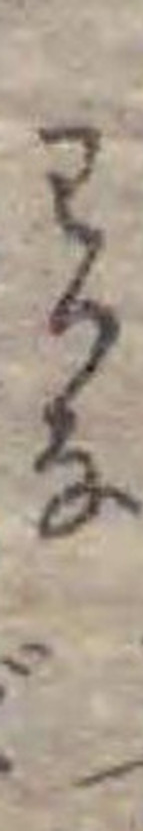わかな
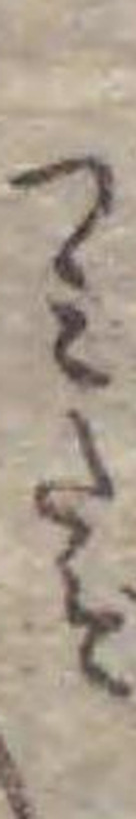つみたぞ
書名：年始御礼帳 : 3巻
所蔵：国立国会図書館 National Diet Library, JAPAN
